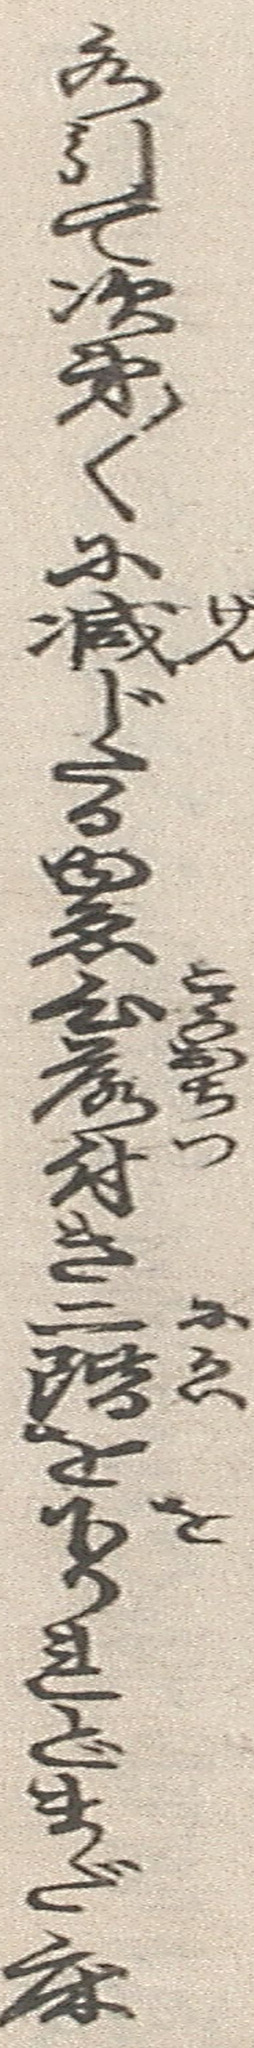水引て次第〳〵に減じたるゆゑ心落付き二階を下りれどまだ床
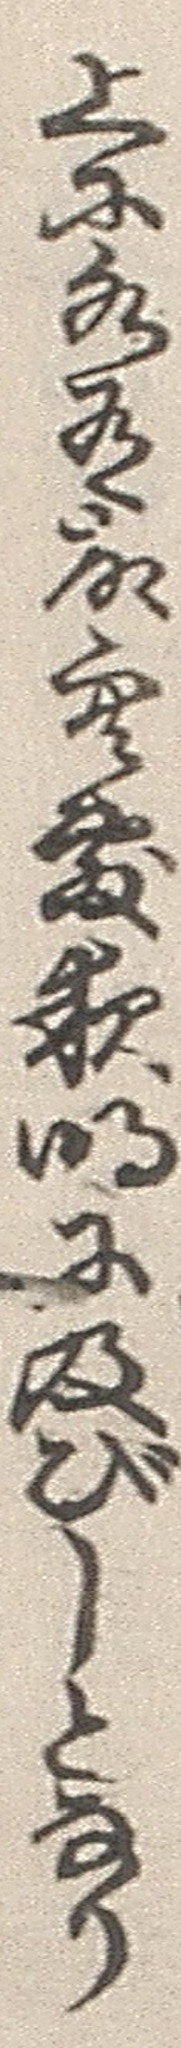上に水有る故空敷夜明に及びしとなり
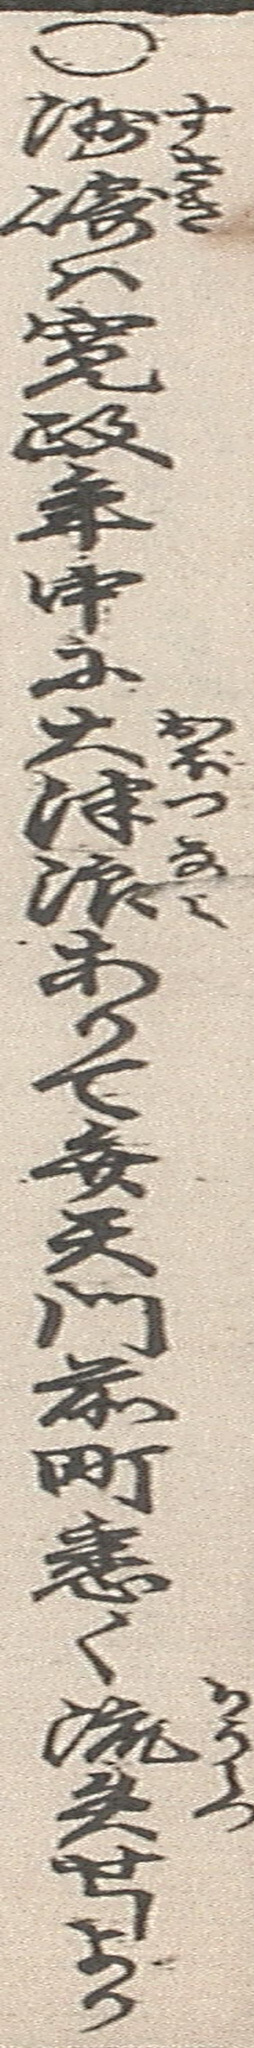◯洲崎ハ寛政年中に大津浪ありて弁天門前悉く流失せしより
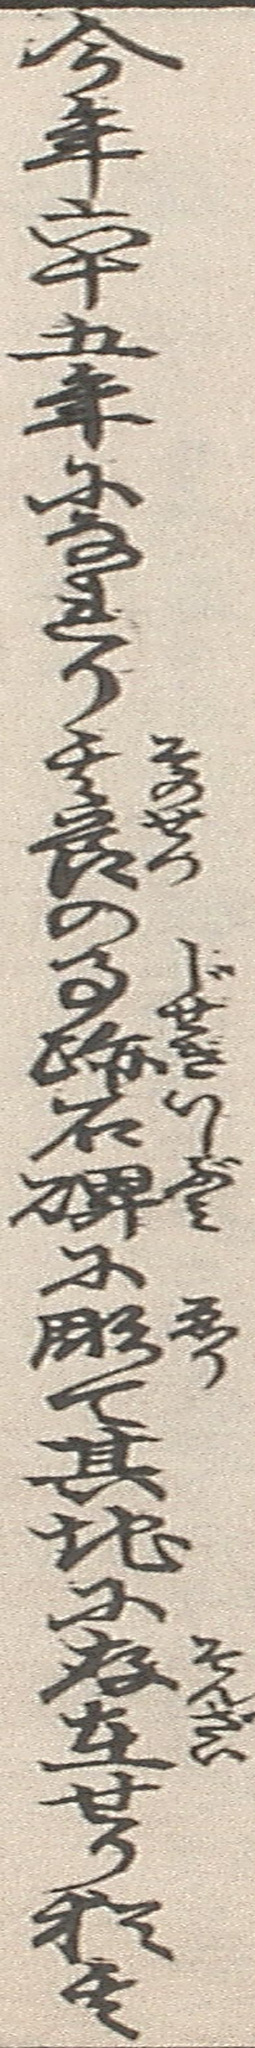今年六十五年になれり其節の事跡石碑に彫て其地に存在せり猶其
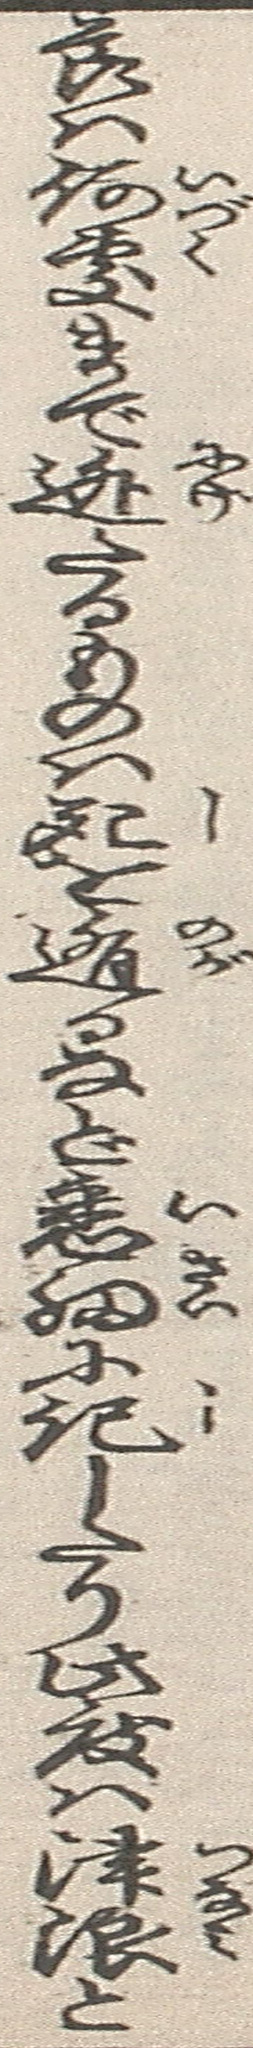節ハ何処まで逃たるものハ死を遁るなど悉細に記したり此度ハ津浪と
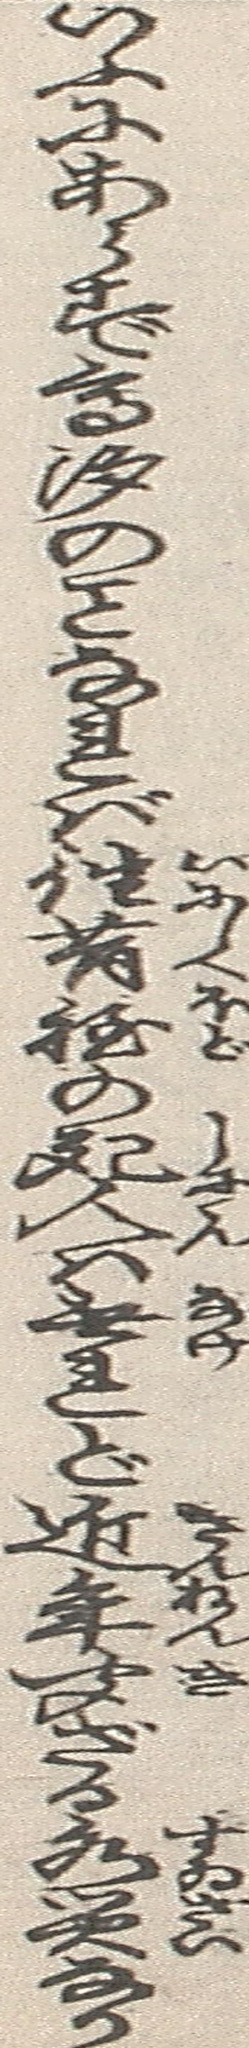いふにあらず高汐のことならバ往昔程の死人ハ無れど近年聞ざる水災なり
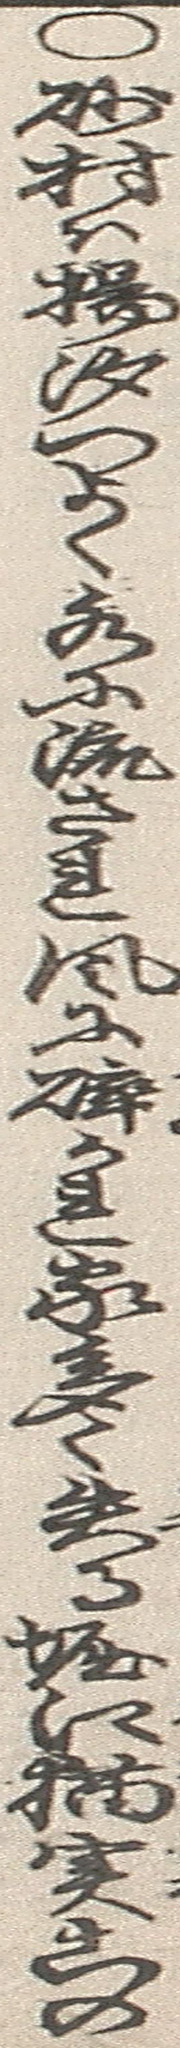◯砂村ハ揚汐つよく水に流され風に砕かれ家多く失る掘江猫実この
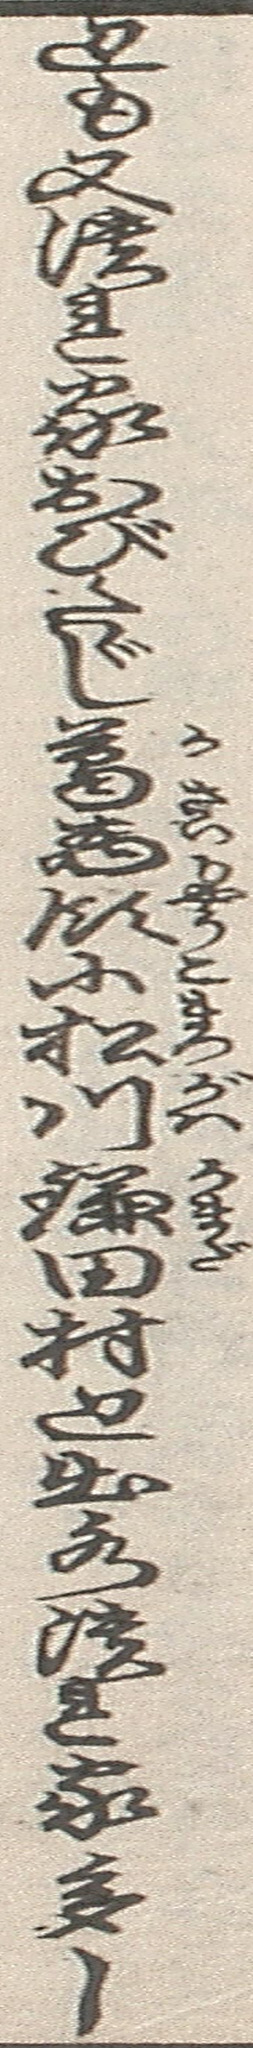辺も又潰れ家おびたゞし葛西領小松川鎌田村辺出水潰れ家多し
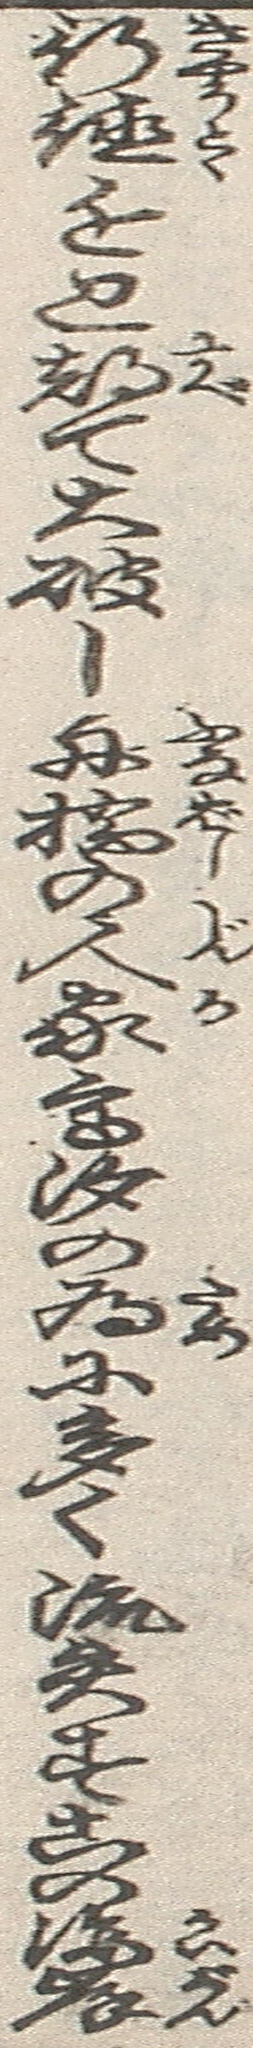行徳近辺都て大破し舟橋の人家高汐の為に多く流失すこの海岸
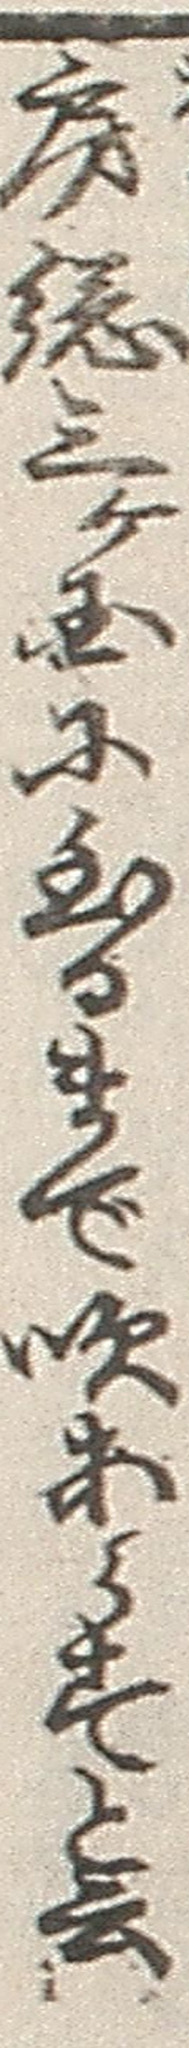房総三ヶ国に至るまで吹あらすと云
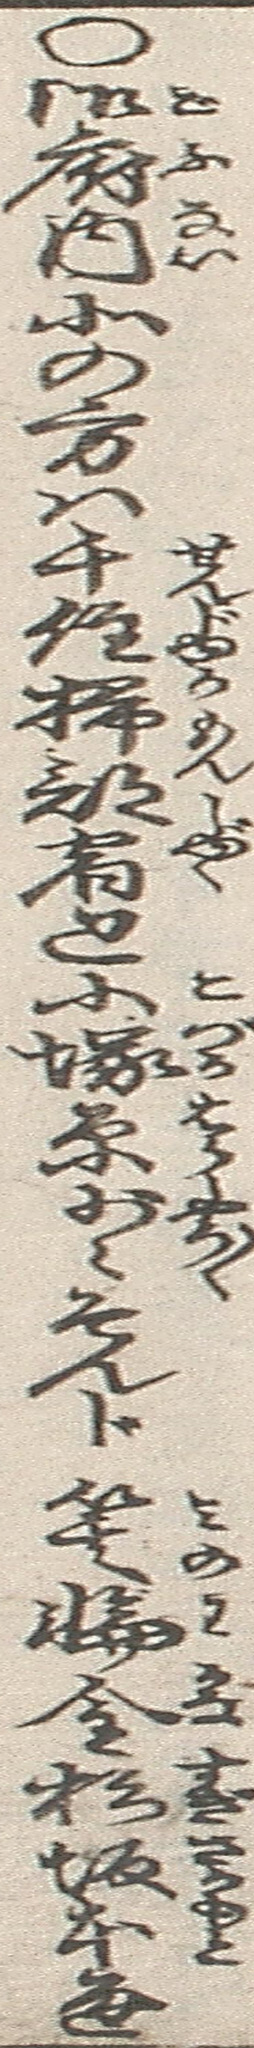◯御府内北の方ハ千住掃部宿辺小塚原少々そんじ箕輪金杉坂本通
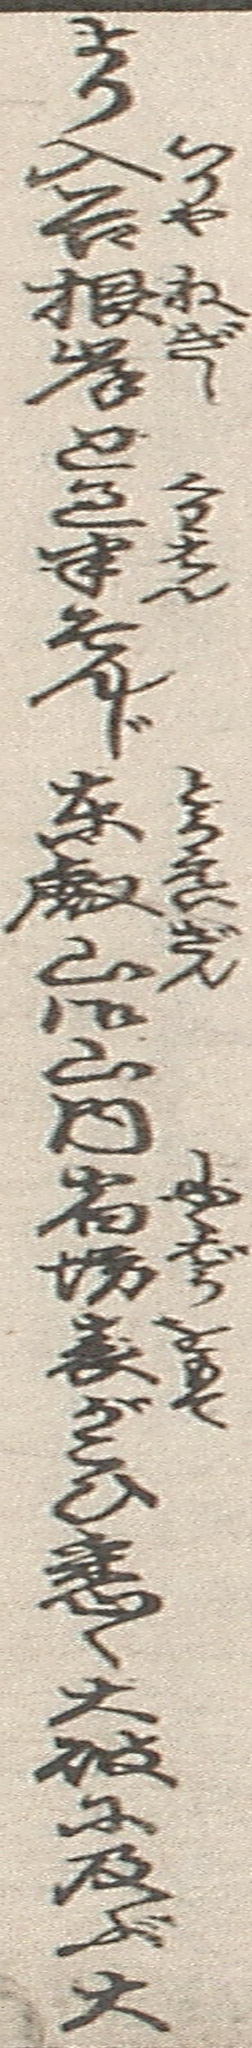より入谷根岸辺過半そんじ東栄叡山御山内宿坊表がこひ悉く大破に及ぶ大
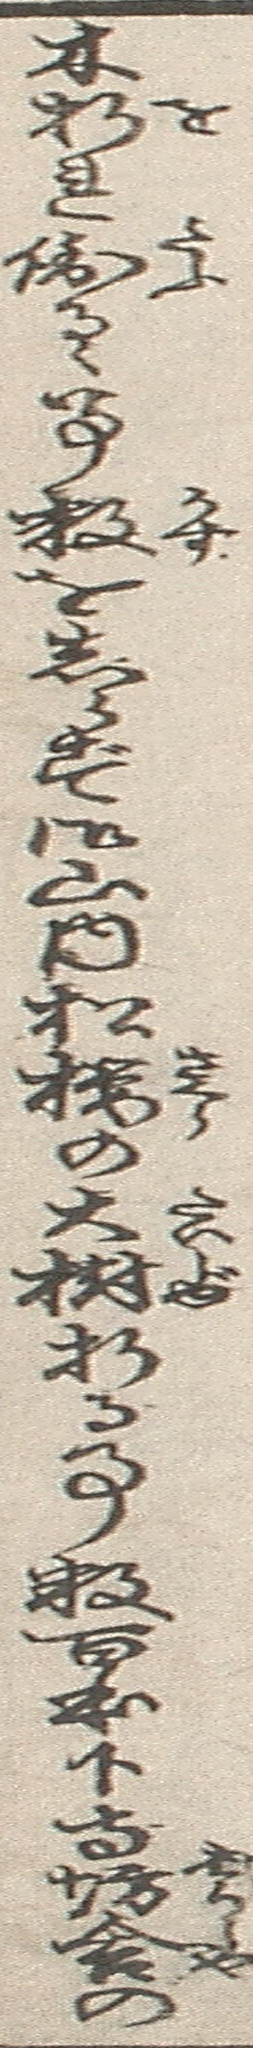木折れ倒るゝ事数をしらず御山内松桜の大樹折る事数百本下寺坊舎の

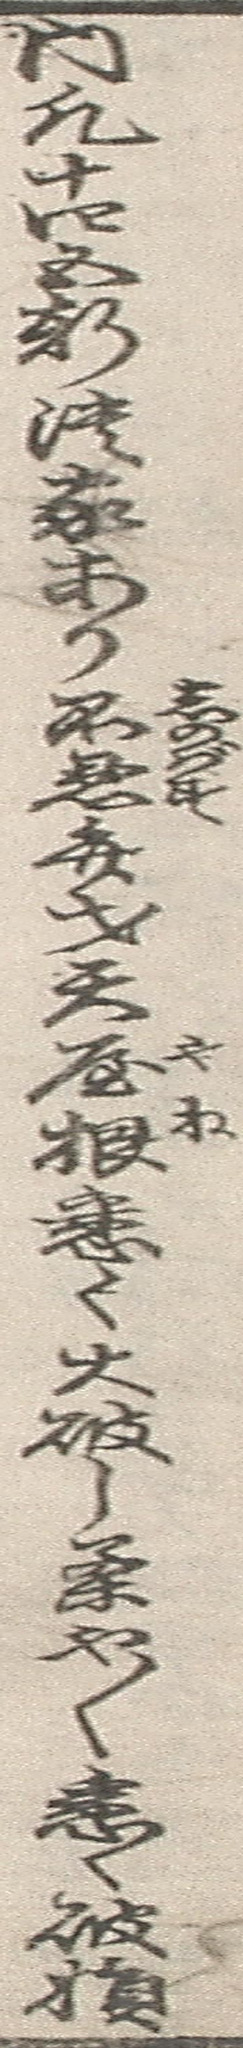内凡十四五軒潰家あり不忍弁才天屋根悉く大破し茶や〳〵悉く破損
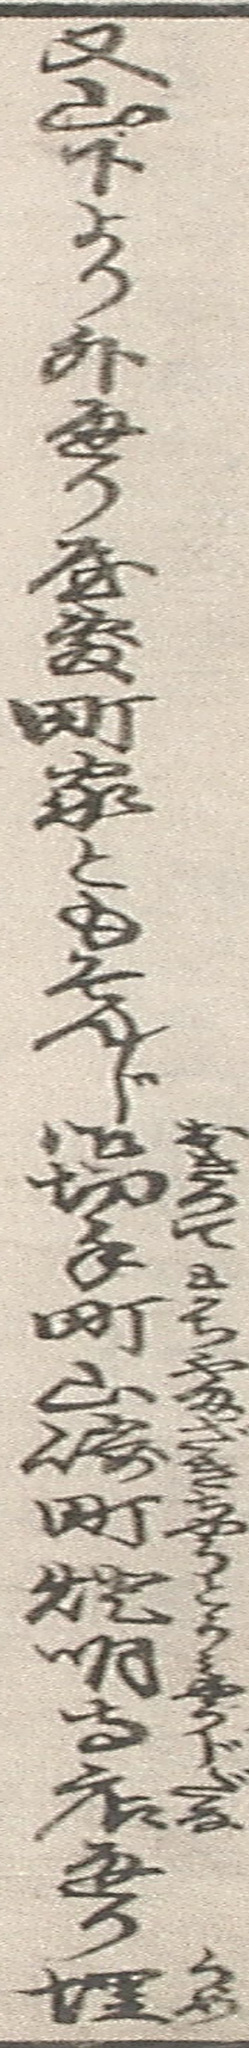又山下より外通り屋敷町家ともそんじ御切手町山崎町燈明寺店通り埋
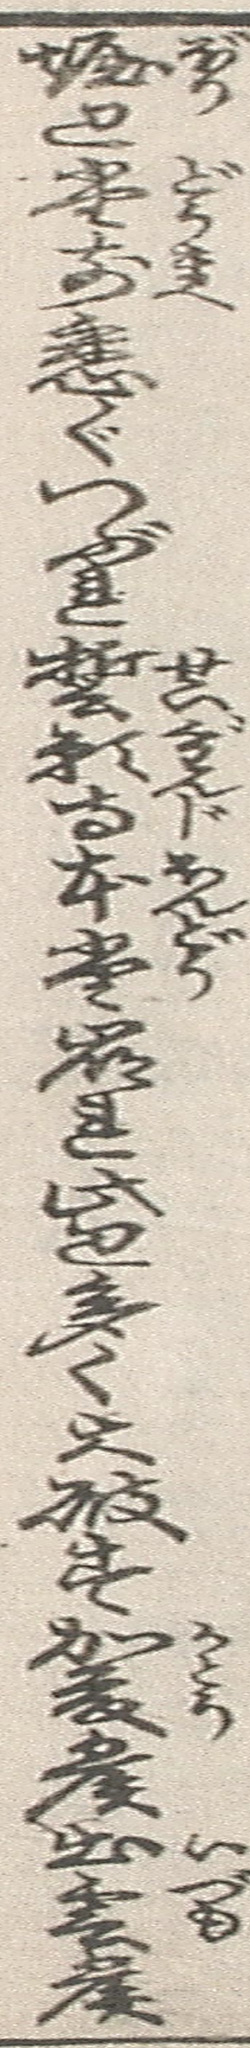堀辺堂前悉くつぶれ誓願寺本堂崩れ此辺多く大破す加藤矦出雲矦
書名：安政風聞集　上中下　全
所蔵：東京大学地震研究所図書室 Earthquake Research Institute Library, The University of Tokyo, JAPAN
